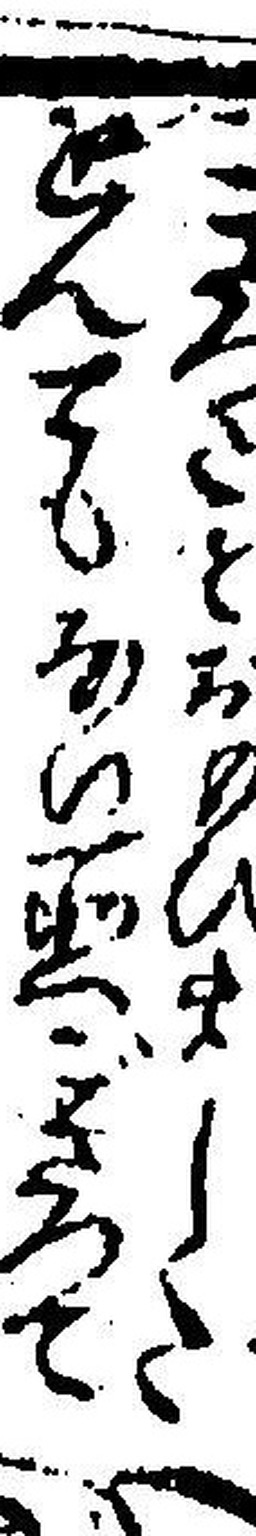とんてもない所へごさつて
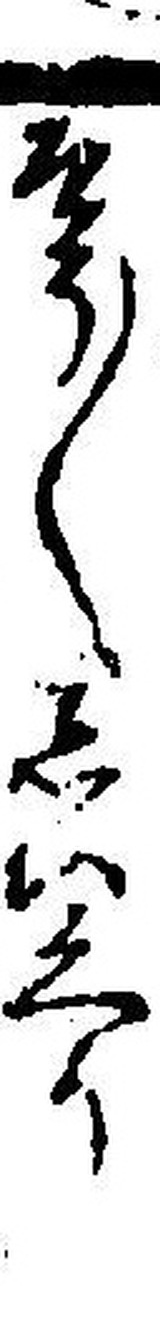そう〳〵しいかへり
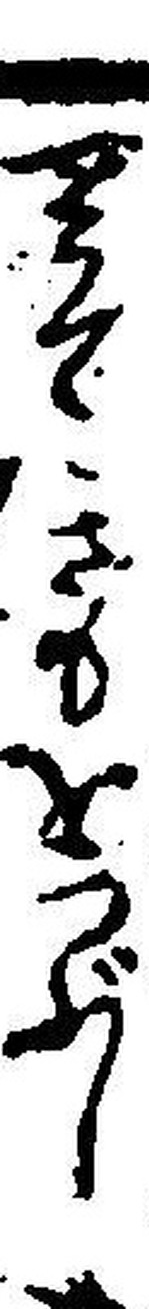やうてきもをつぶし
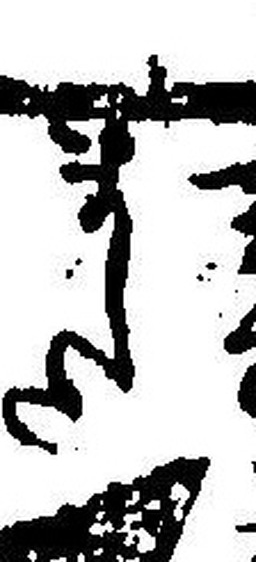ました
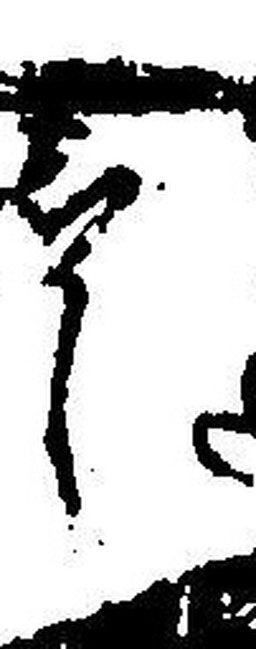しかし
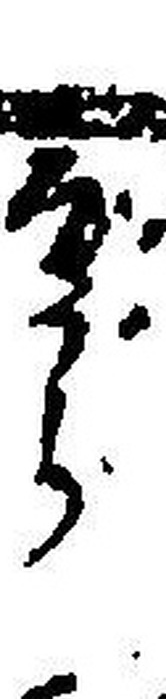ながら
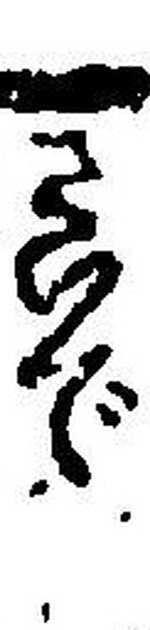さいで
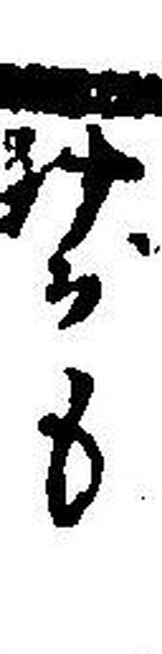みちも
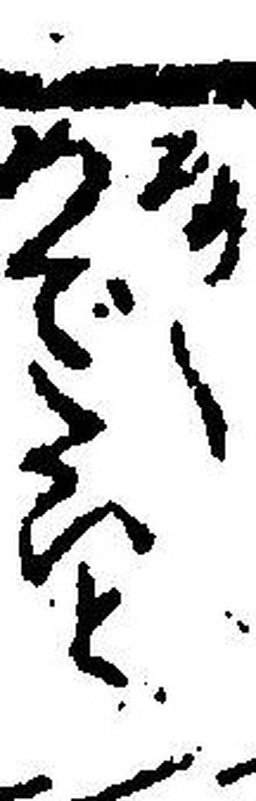めでたいと
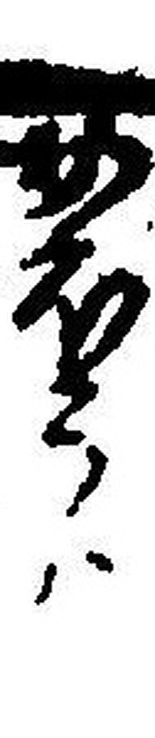女ほうは
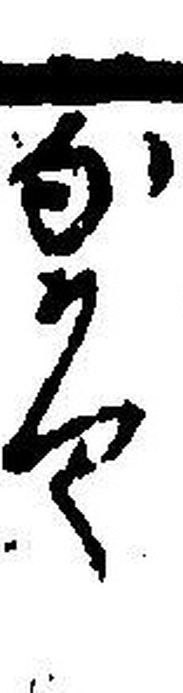なかや
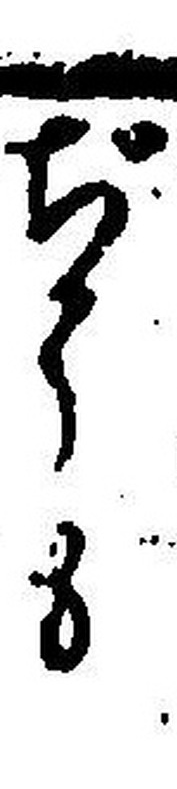ぢうも
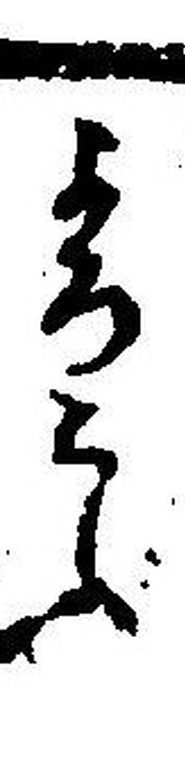よろこぶ

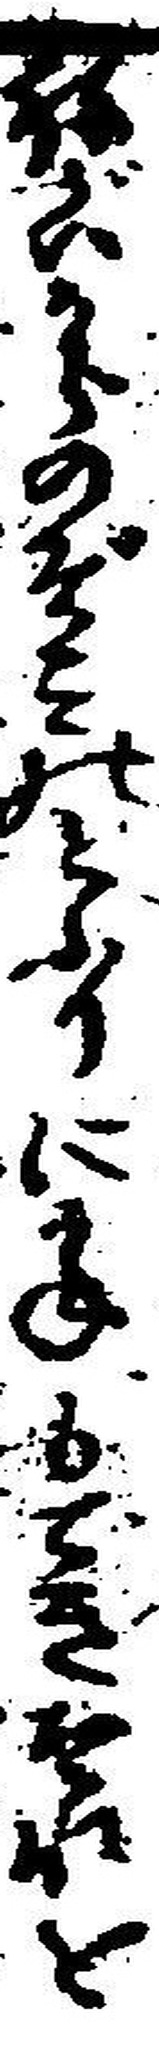ねがいからのぞみのとふりにかねもできそれを
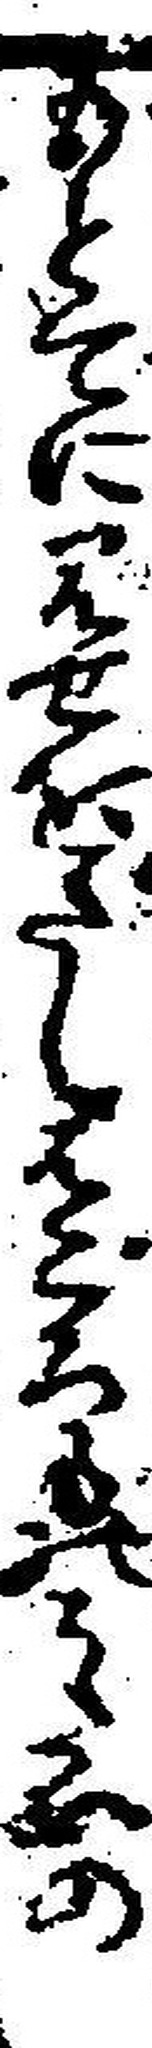もとてにみせをだしはごろものうたいの
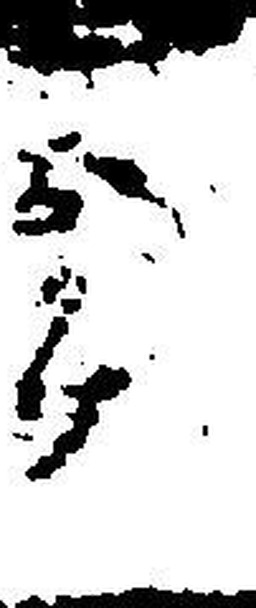おかけ
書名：牡丹餅棚有 / 市場通笑作
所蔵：東京大学総合図書館 General Library in the University of Tokyo, JAPAN
